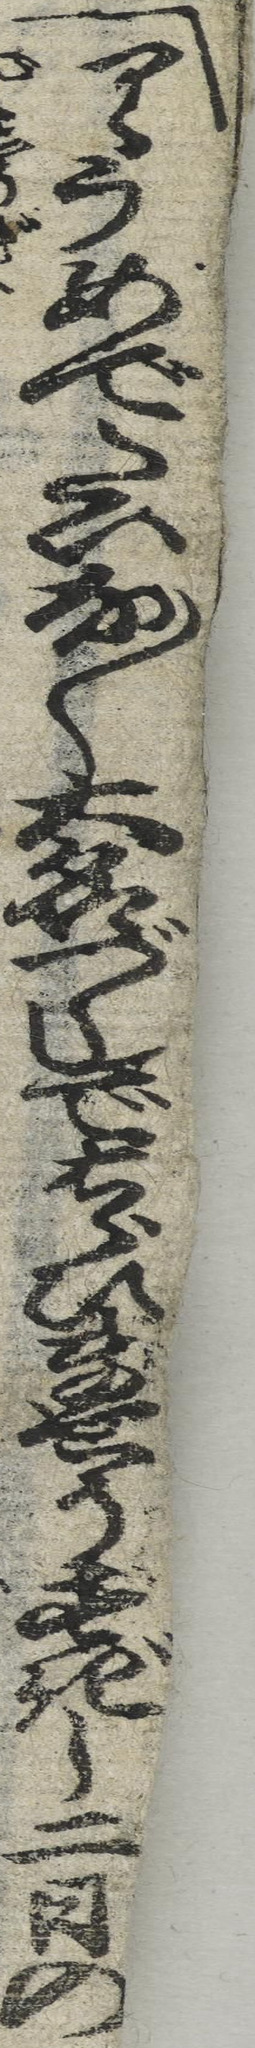〽アヽラめでたいな〳〵大名づくしではらひませうすぎし二日の
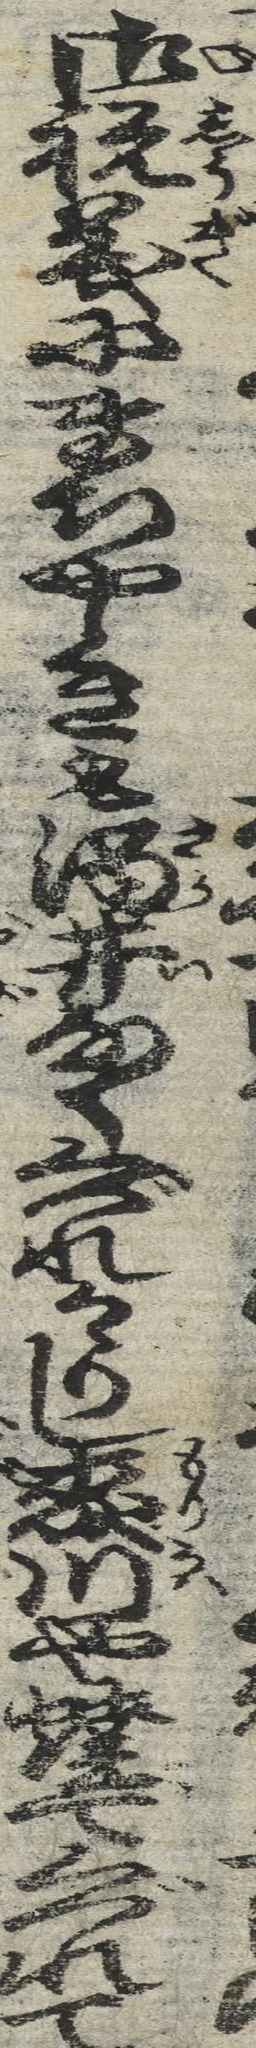御祝義にまちやしきも酒井なくくづれかゝりし森川や焼てくづれて
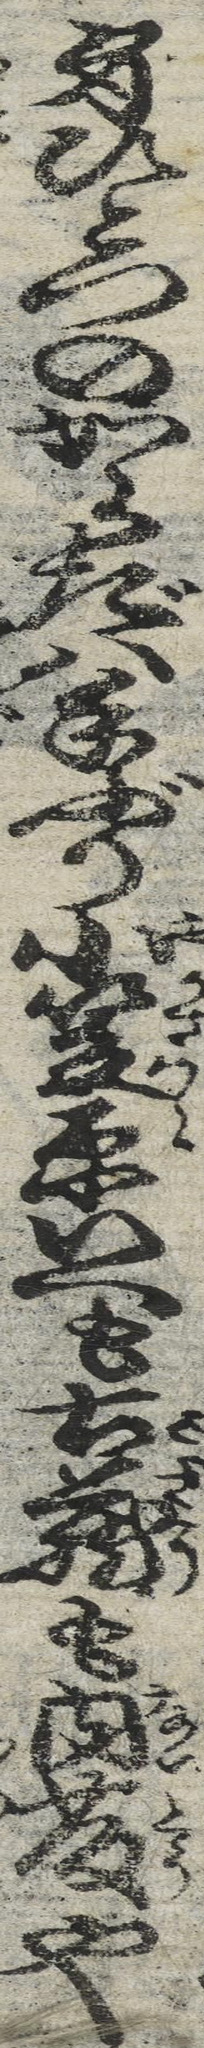身ひとつのからだは手ぶり小笠原いへも古蔵も内藤や
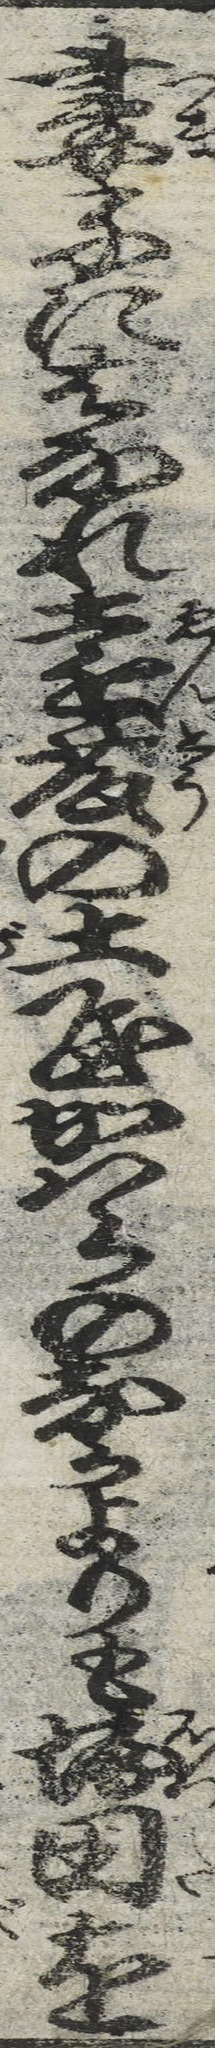妻子にはなれ遠藤の土屋かはらのなかよりも堀田を
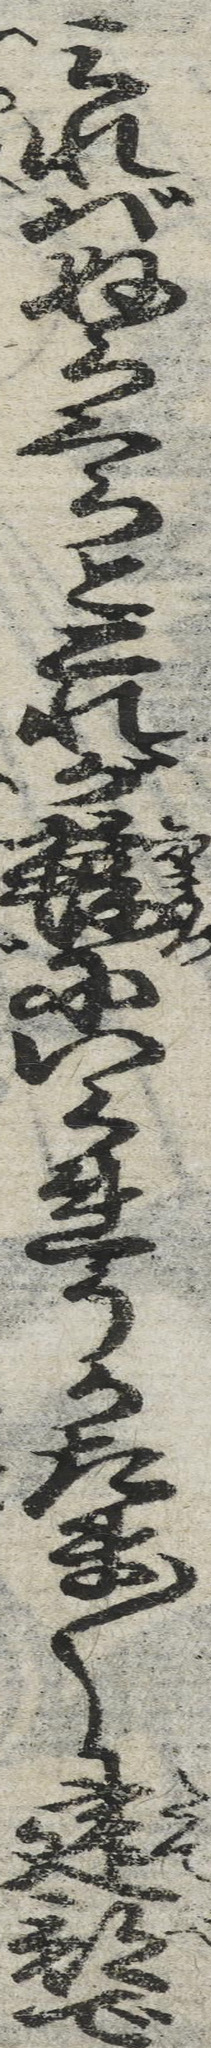みればぬらくらとこれが鯰にいられうかたま〳〵建部で
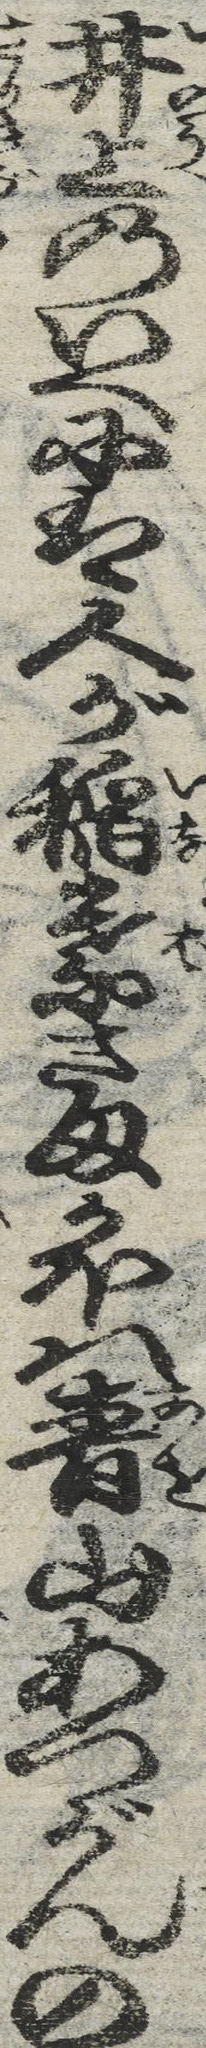井上のいへに有人が稲葉さまかほは青山あつがんの
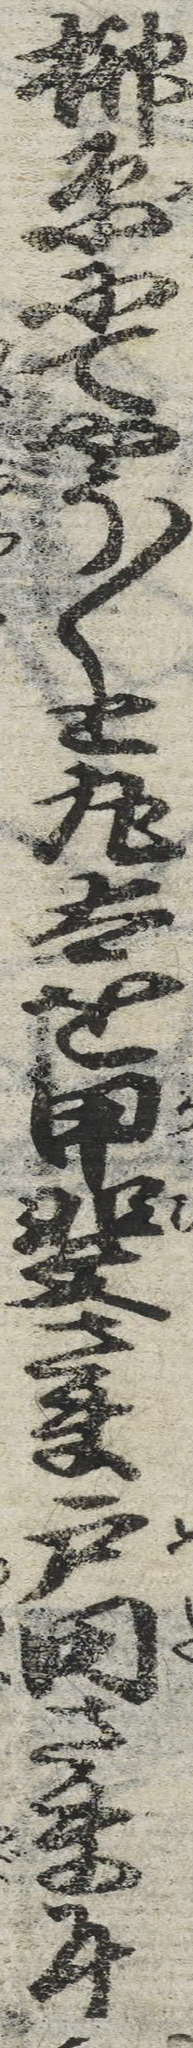榊原にてやう〳〵と丸太を甲斐さま戸田さまに
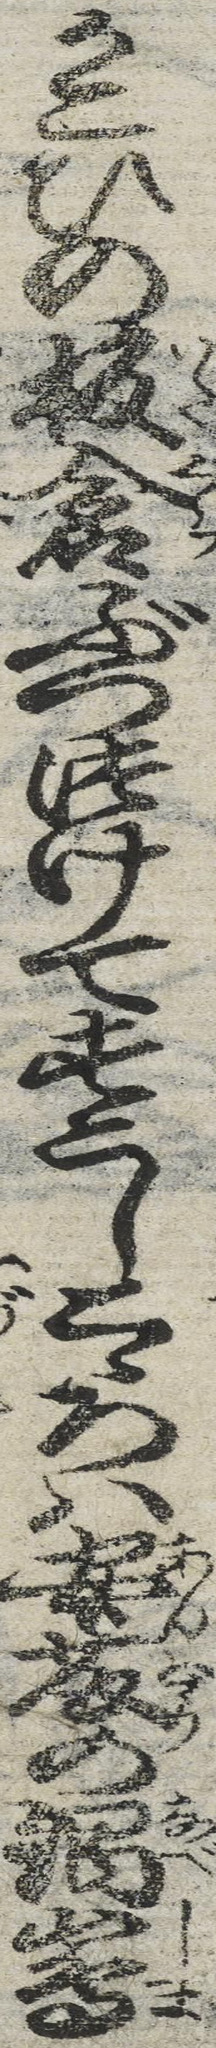かこひの板倉ぶつつけてすこしこゝろは安藤の鍋嶋
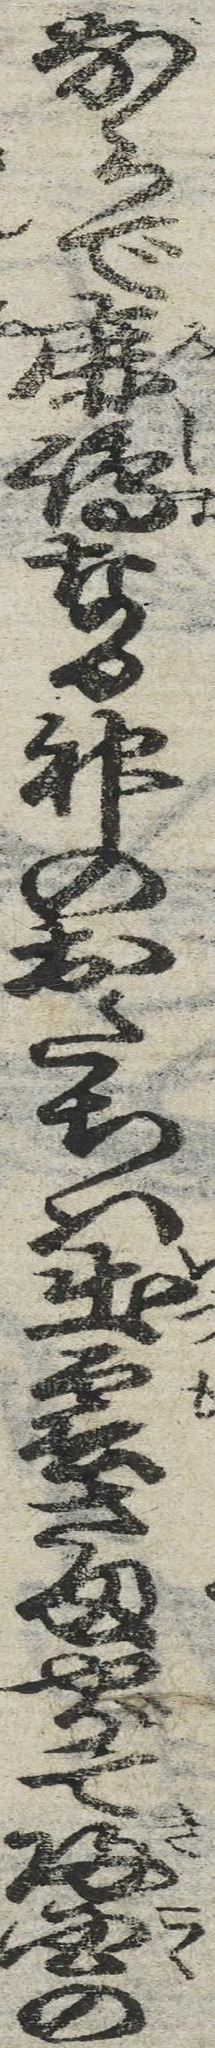ならで鹿嶋なる神のおたちは出雲さまやがて帰国の
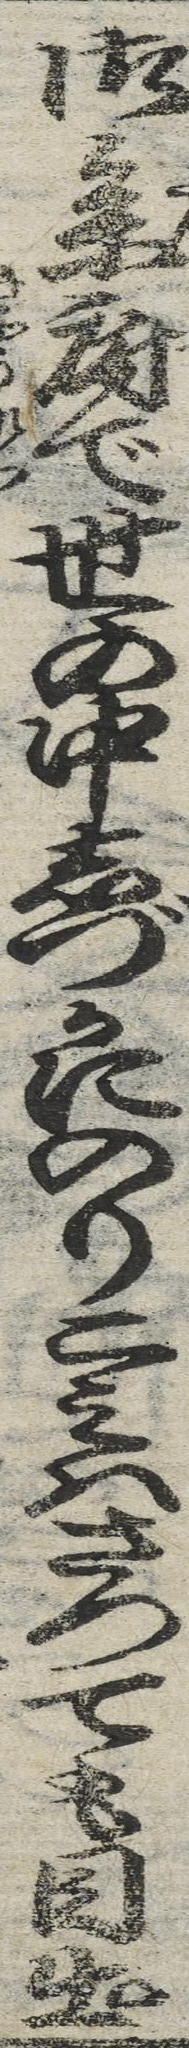御参府で世の中しづかにのりこみはさつても目出
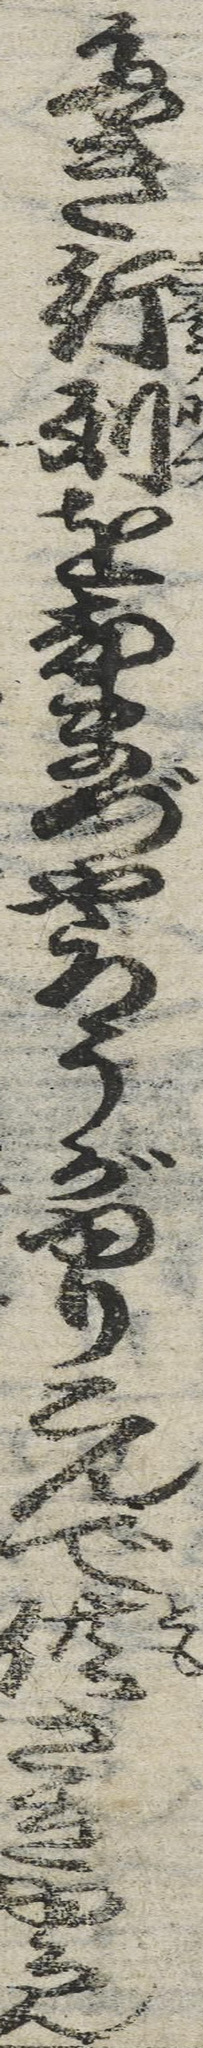たき行列をなまづやろうがゆりこんで供さきやらん
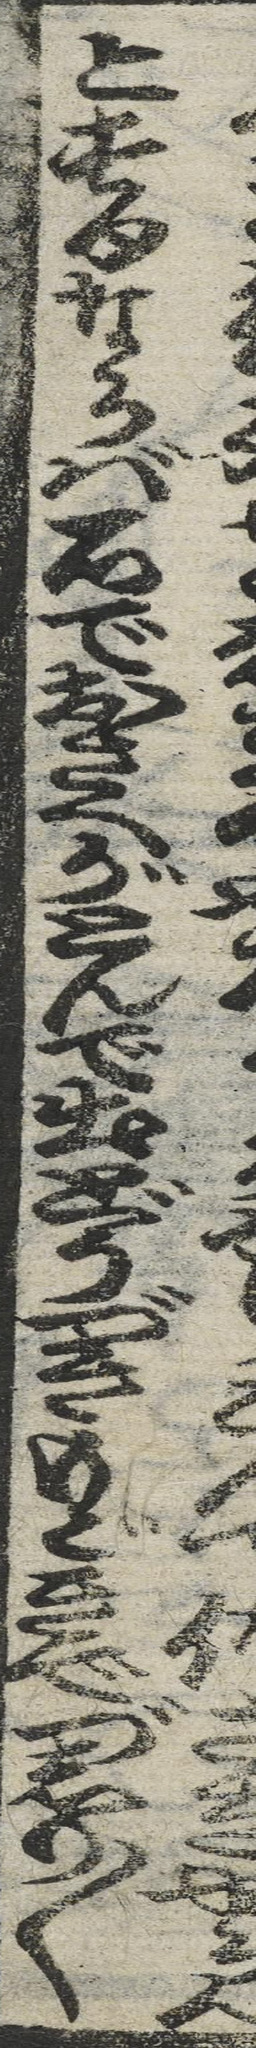とするならば石でおさへがとんで出どうづきもどきでづしり〳〵
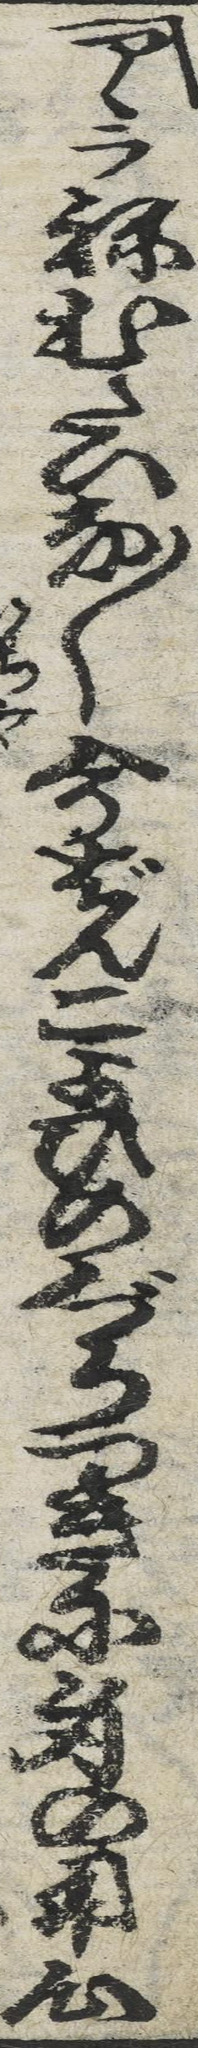〽アヽラねむたいな〳〵今ばんこよひのぐらつきに身の用心
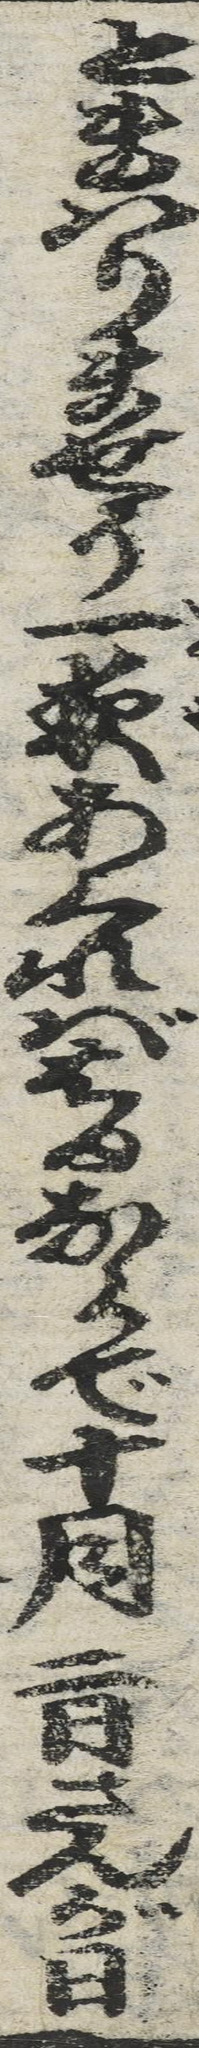とまはりませう一夜あくればはるならで十月二日さんが日
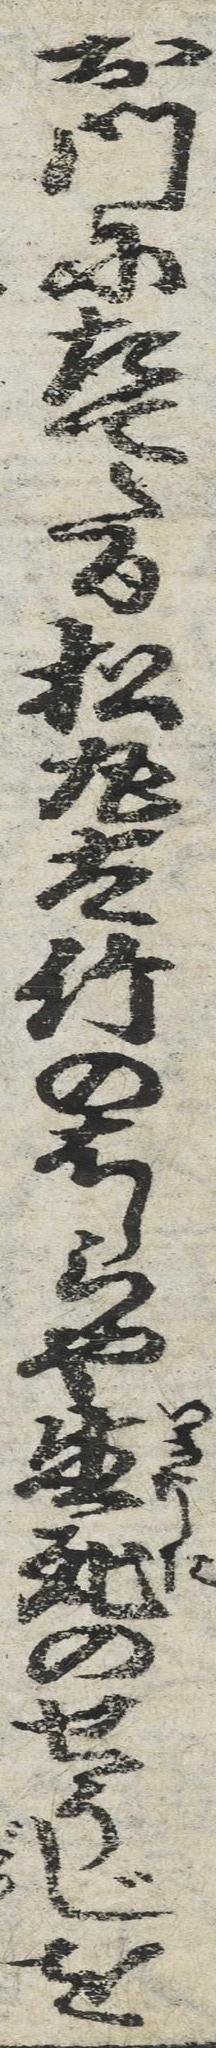お門にたてたる松丸太竹のはしらや生死のせうじを
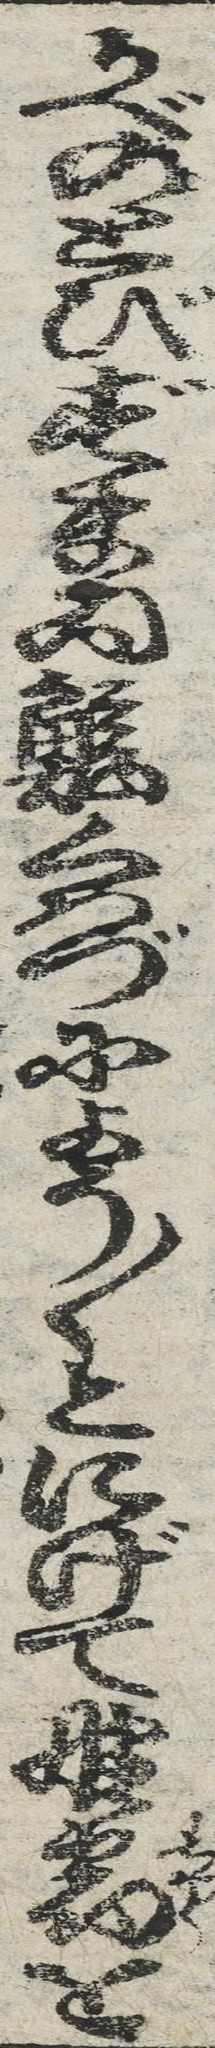かべのとびずまゐ鯰くはづによう〳〵とにげて野宿を
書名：地震やくはらひ
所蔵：東京大学地震研究所図書室 Earthquake Research Institute Library, The University of Tokyo, JAPAN
